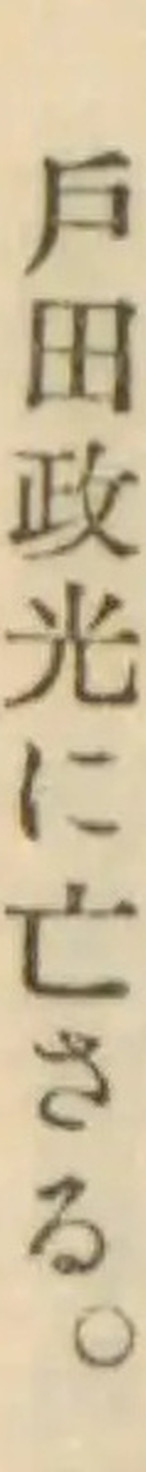戸田政光に亡さる。
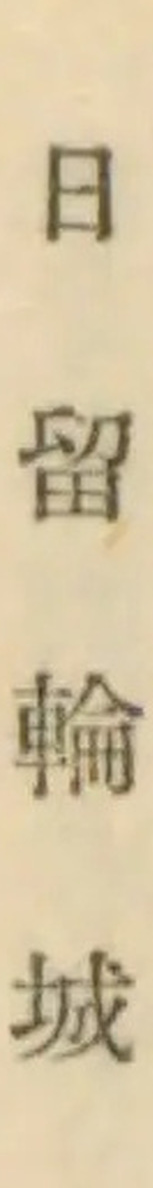日留輪城
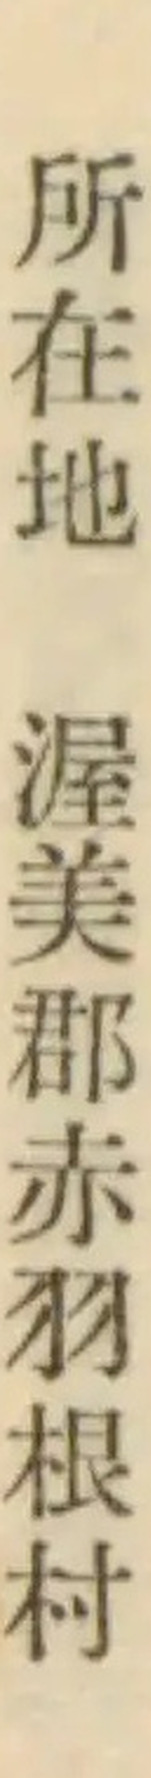所在地渥美郡赤羽根村
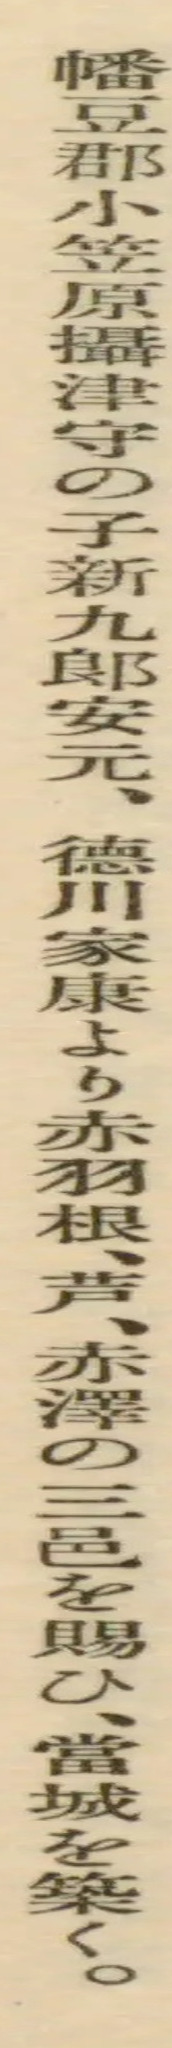幡豆郡小笠原摂津守の子新九郎安元、徳川家康より赤羽根、芦、赤澤の三邑を賜ひ、当城を築く。
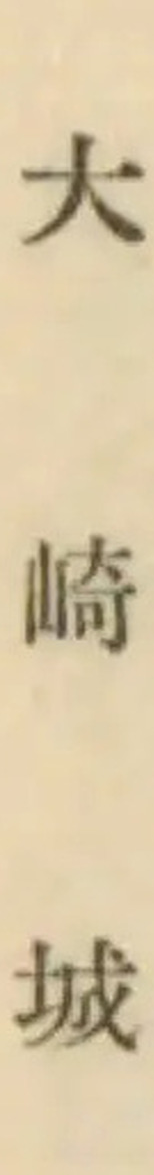大崎城
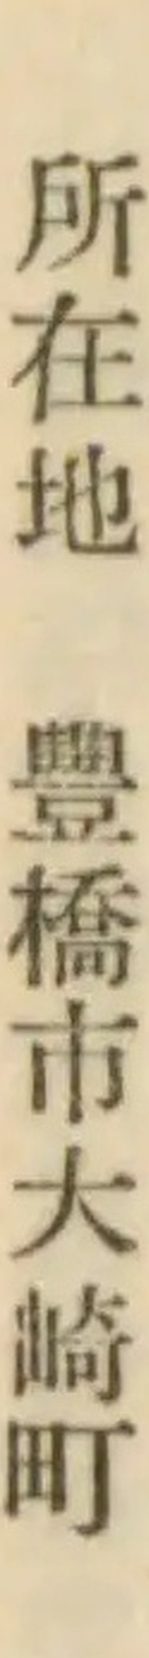所在地豊橋市大崎町
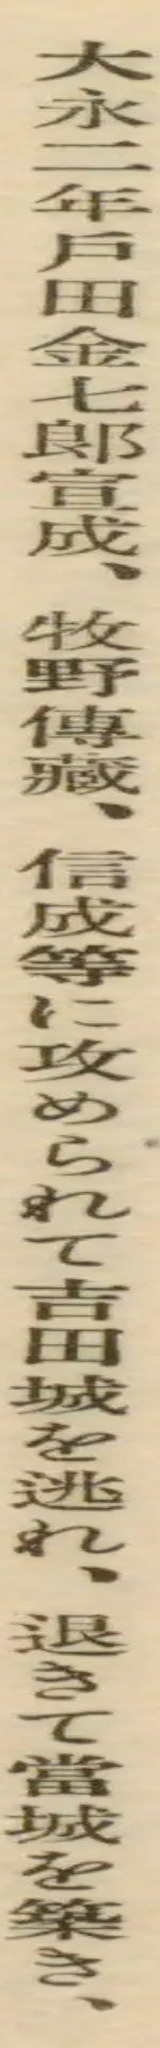大永二年戸田金七郎宣成、牧野傳蔵、信成等に攻められて吉田城を逃れ、退きて当城を築き、
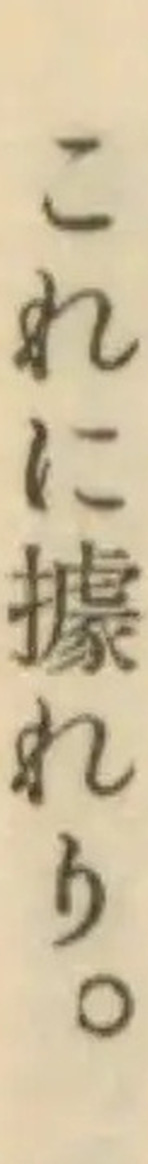これに拠れり。
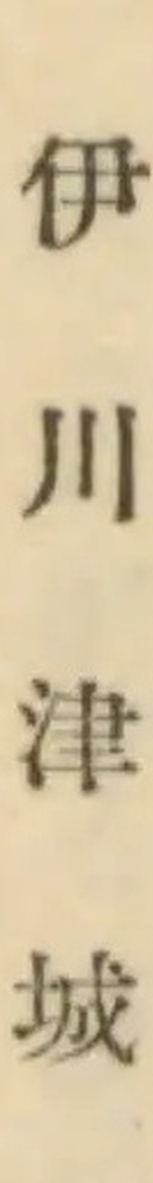伊川津城
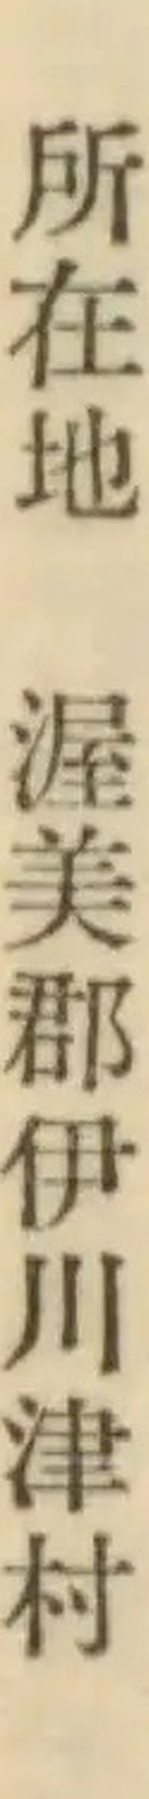所在地渥美郡伊川津村
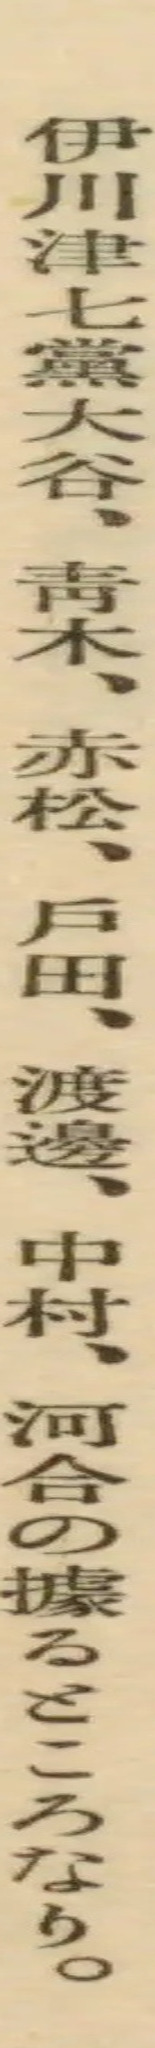伊川津七党大谷、青木、赤松、戸田、渡邊、中村、河合の拠るところなり。
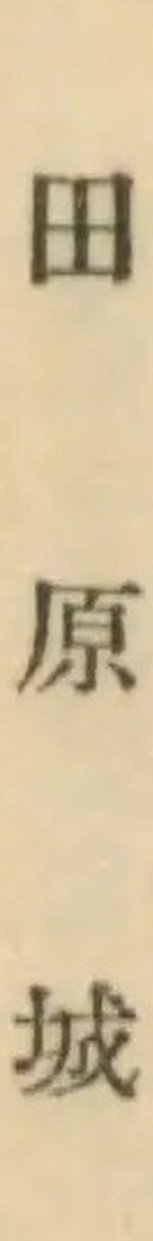田原城
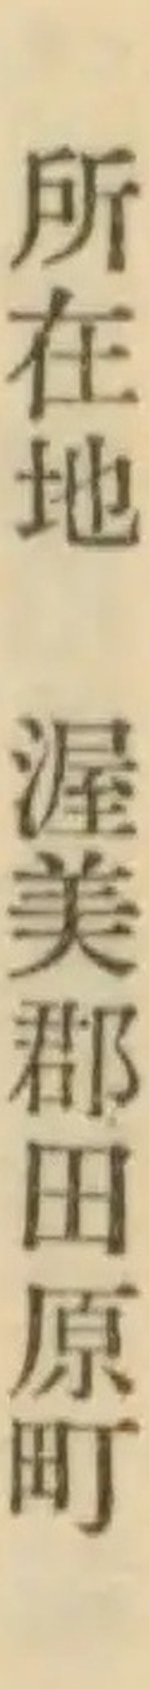所在地渥美郡田原町
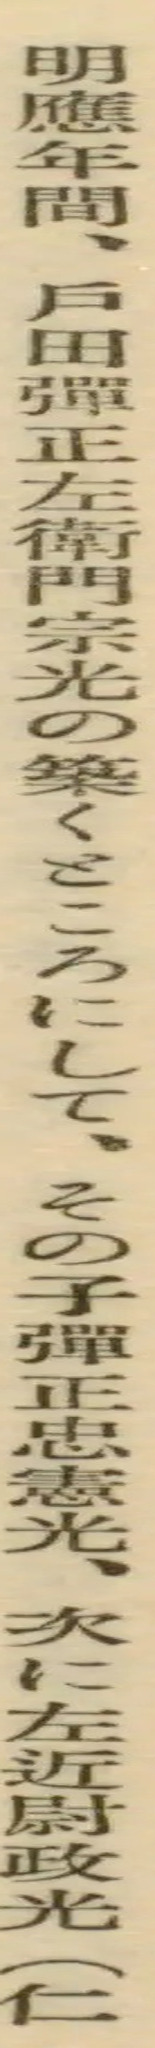明応年間、戸田弾正左衛門宗光の築くところにして、その子弾正忠憲光、次に左近尉政光(仁
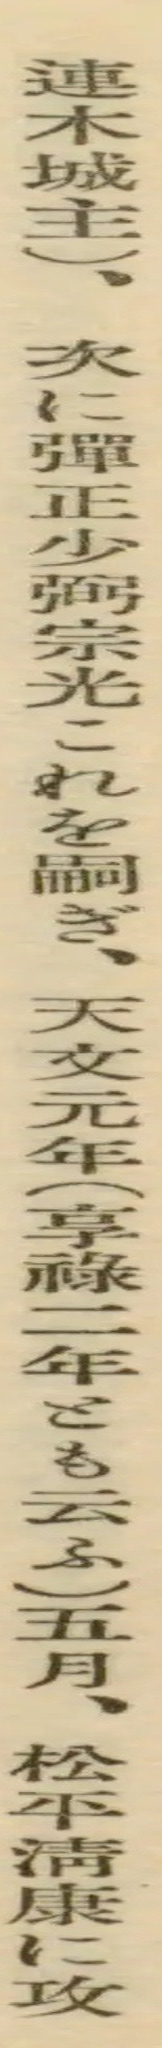連木城主)、次に弾正少弼宗光これを嗣ぎ、天文元年(享禄二年とも云ふ)五月、松平清康に攻
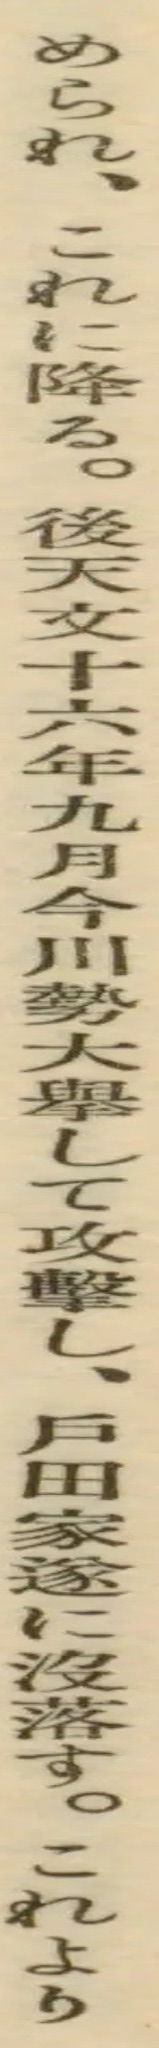められ、これに降る。後天文十六年九月今川勢大挙して攻撃し、戸田家遂に没落す。これより
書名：東三河之古城
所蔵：国立国会図書館 National Diet Library, JAPAN
